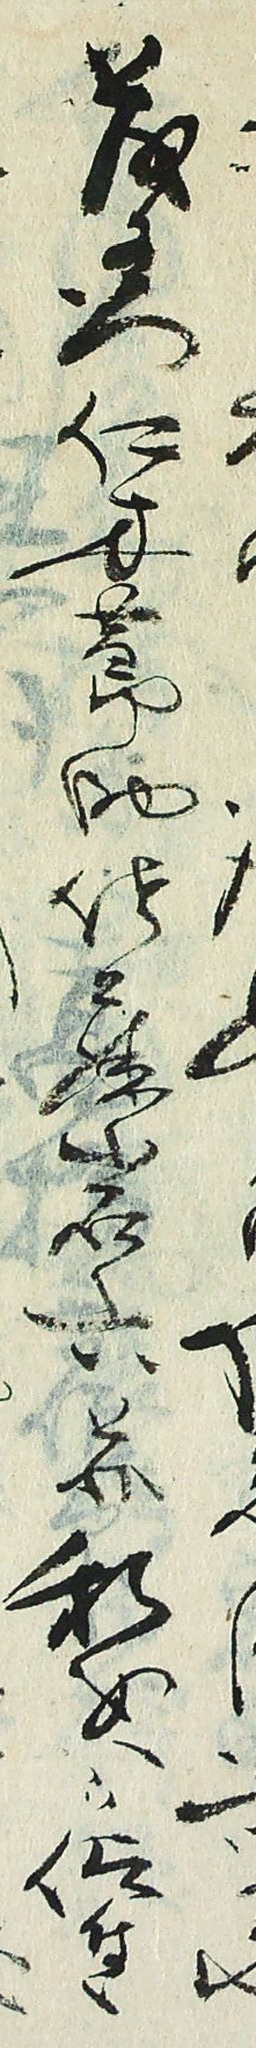茂右衛門仁木節助佐藤岩六并私義へ被仰付候
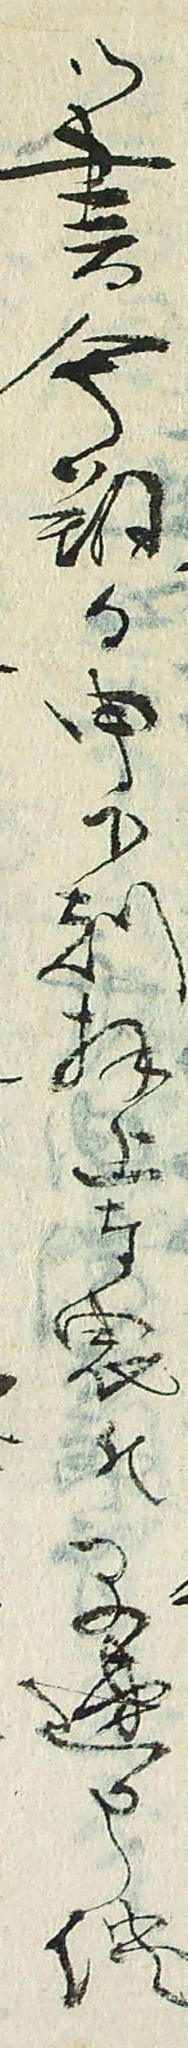御書今朔日申下刻拝上奉畏候早速申談
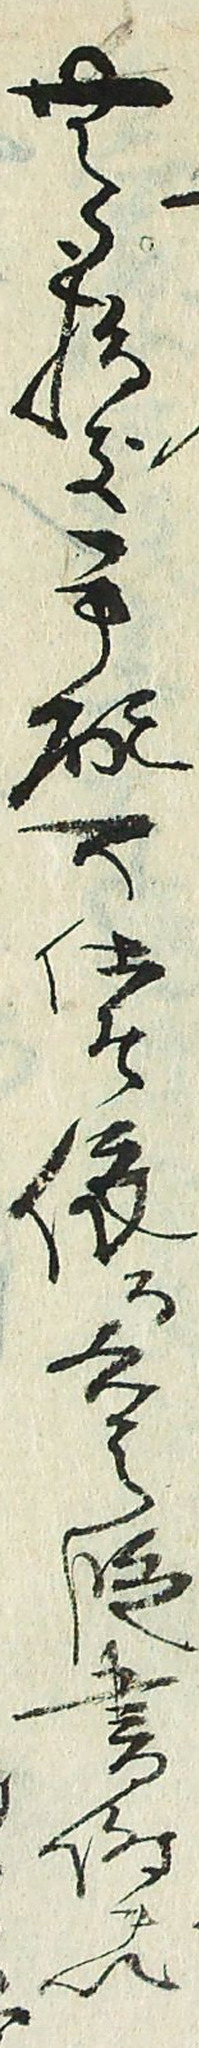無御指支手配可仕候依て右之段書附を以
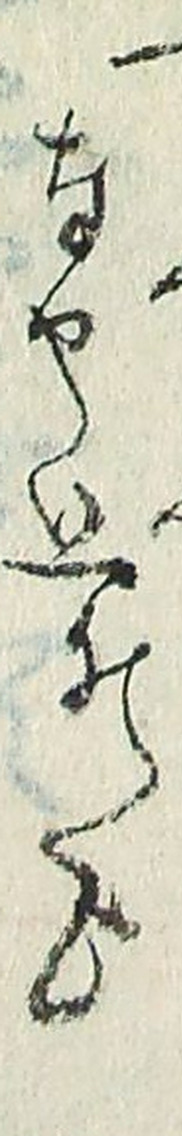奉申上候以上
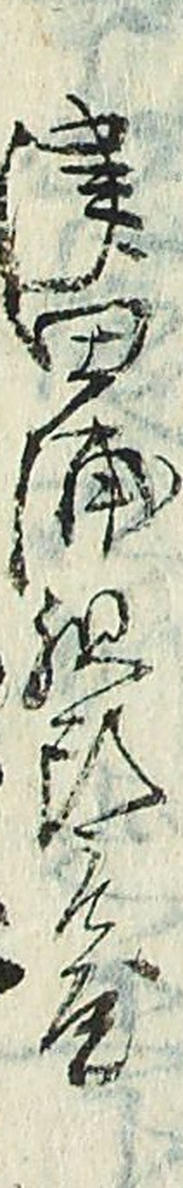津田浦組頭庄屋
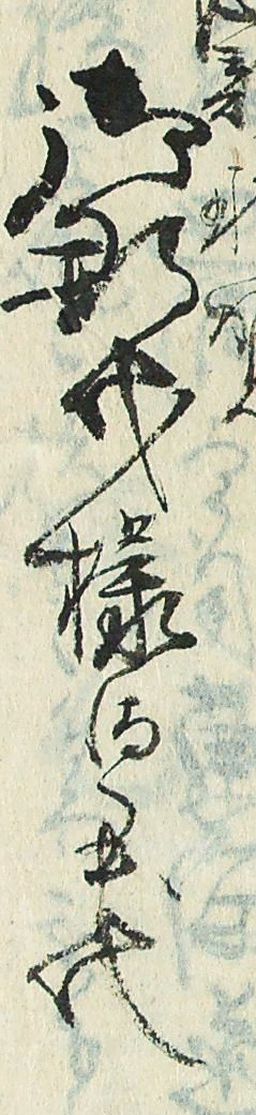御郡代様御手代

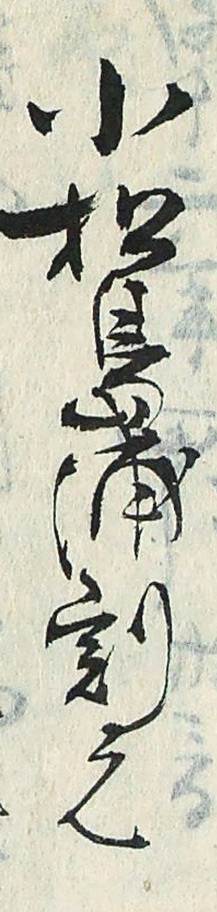小松島浦割元
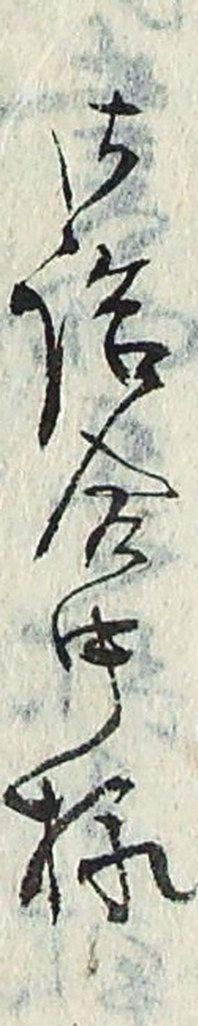御詰合中様
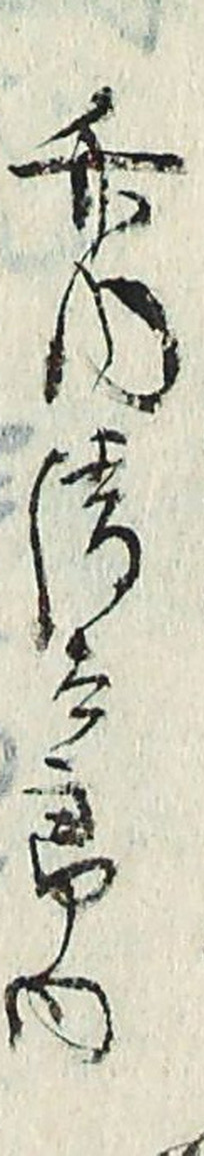竹内清太郎印
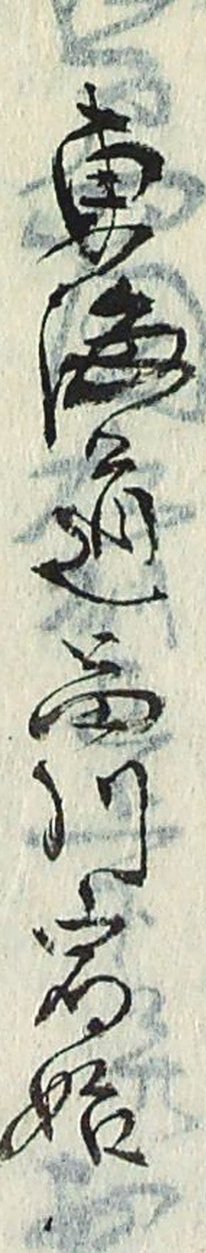東海道品川宿始
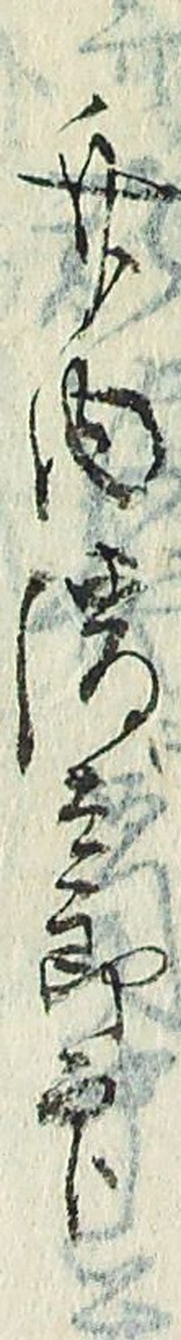竹内清太郎印
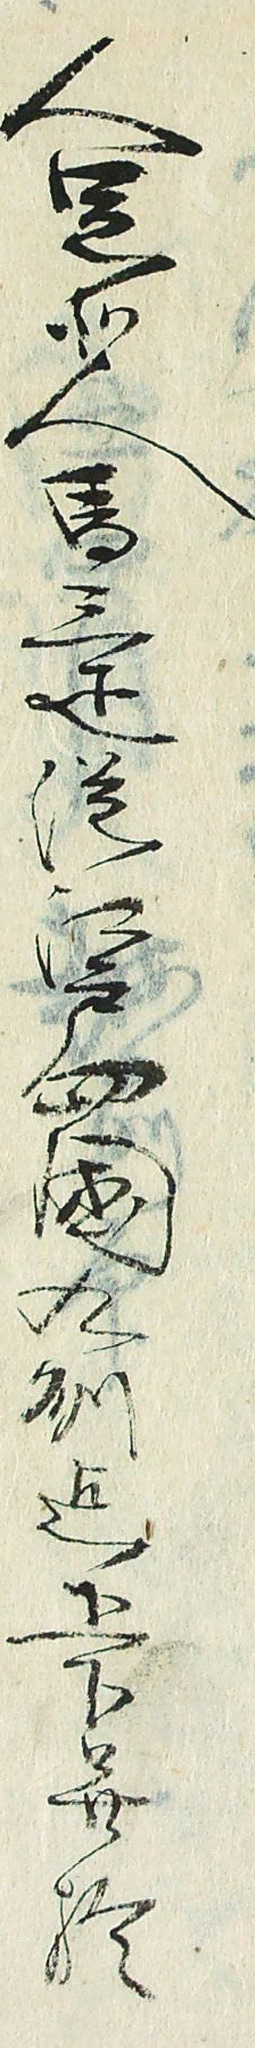人足弐人馬三疋従江戸四国九州迄上下并於
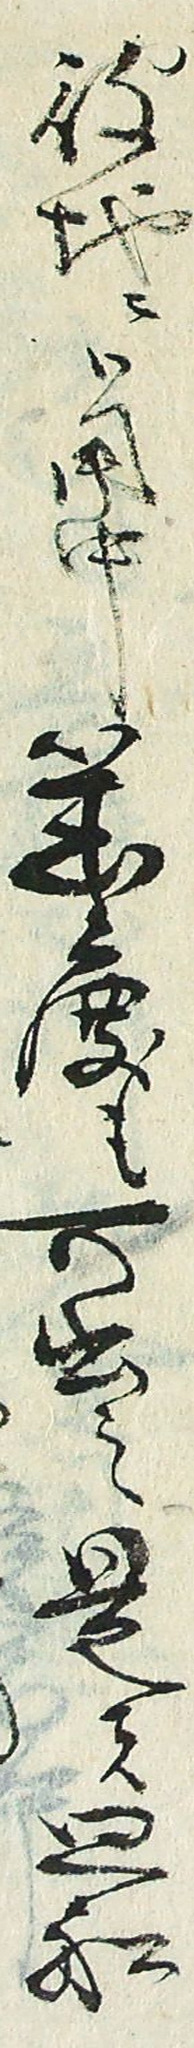彼地に御用中幾度も可出之是は廻船
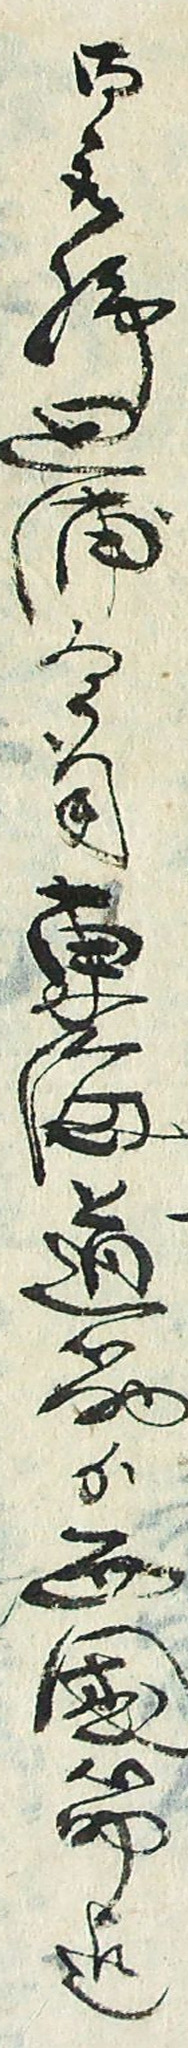御取締廻浦為御用東海道筋ゟ西国筋迄
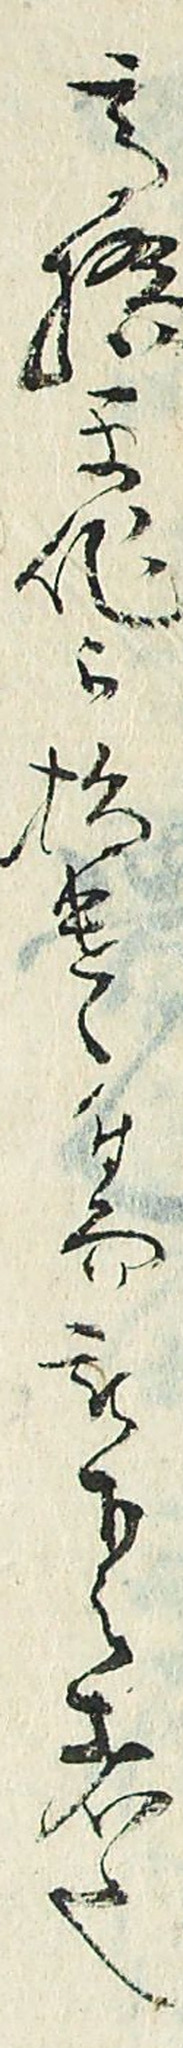高橋平作被指遣候付て被下候者也

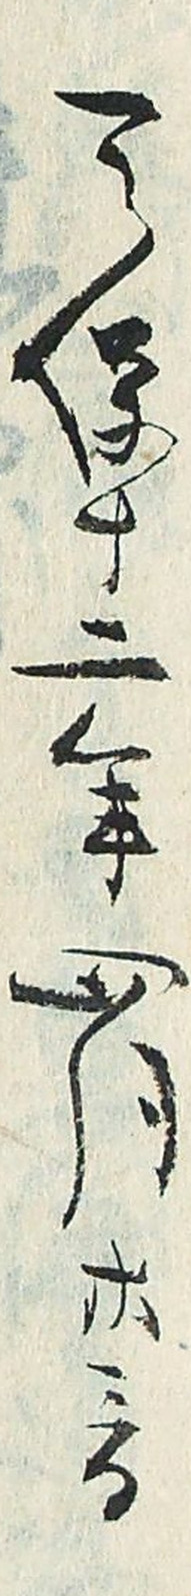天保十二年四月廿三日
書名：公辺御役人為御廻浦御立越諸御用一巻
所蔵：鳴門教育大学 Naruto University of Education
